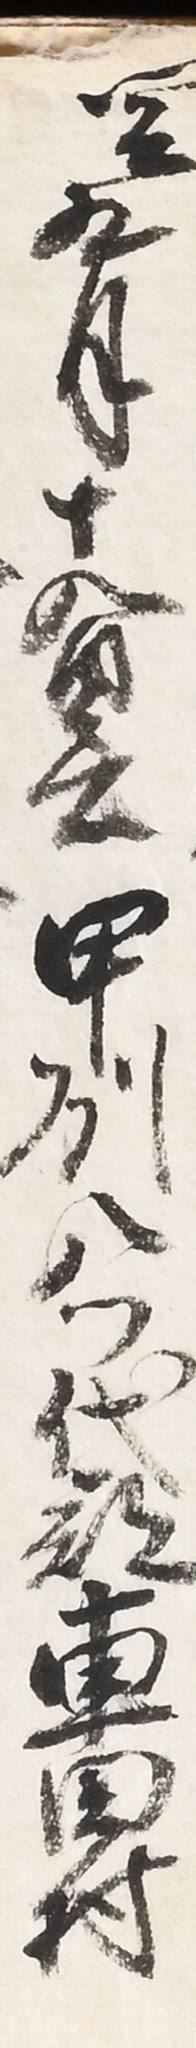閏九月十八日着甲州八ツ代郡車田村
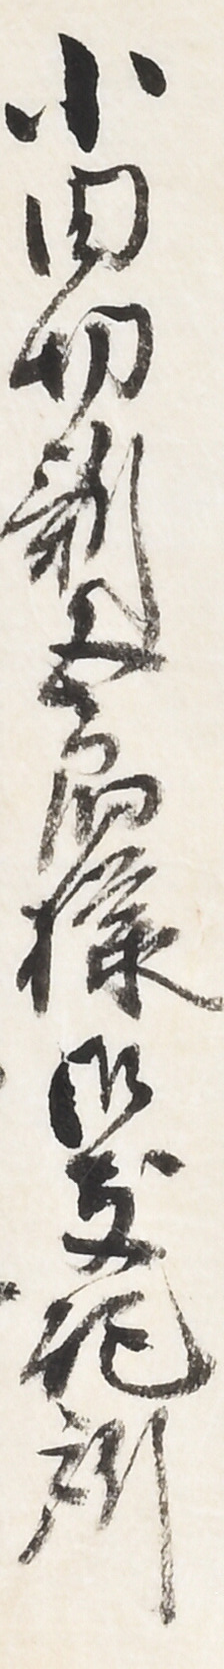小田切新五郎様御支配所
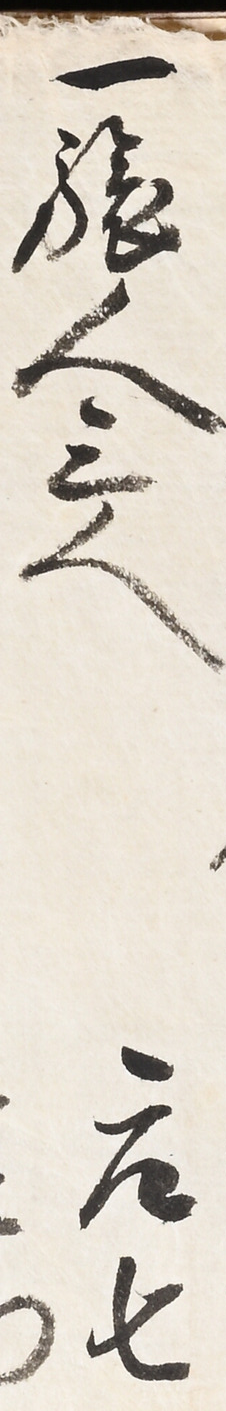一旅人三人庄七
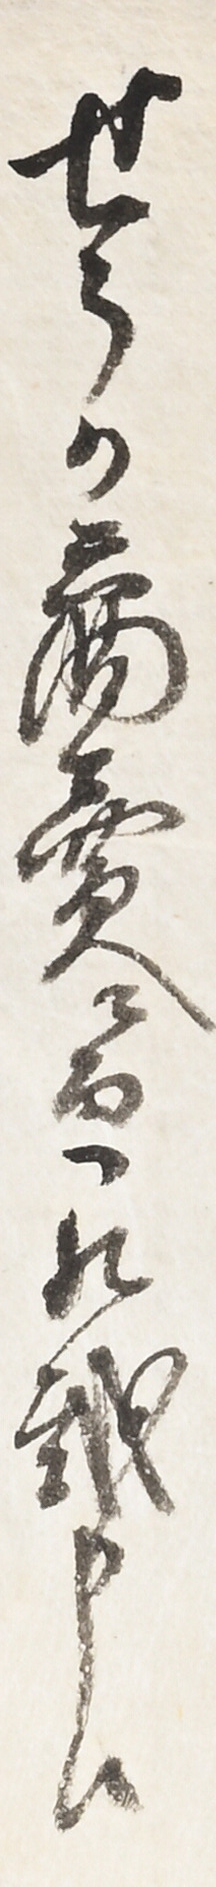せうか商売ニ而罷越申候
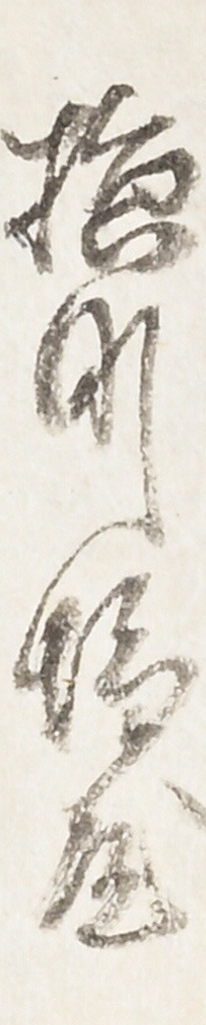横町塩屋
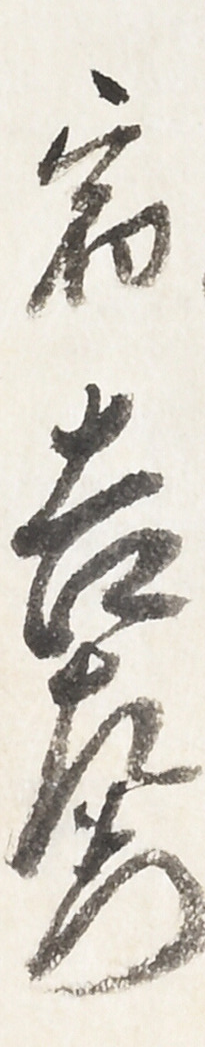宿吉左衛門
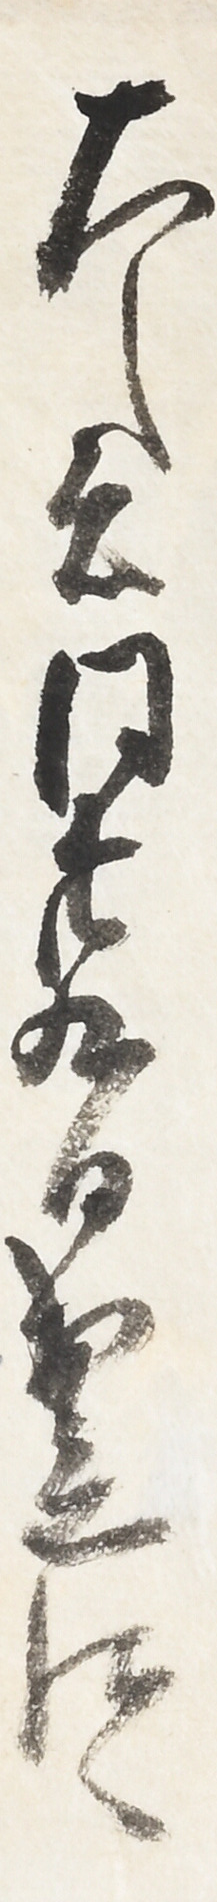右之者同廿九日出立仕候
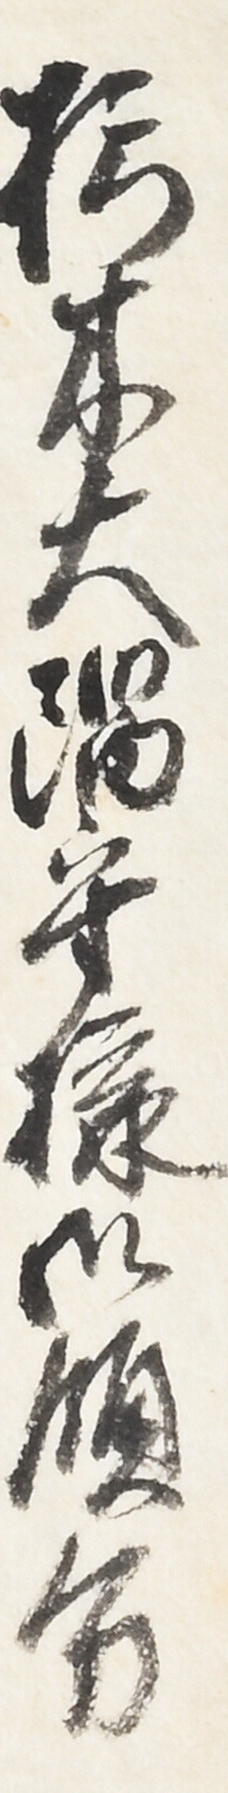朽木大隅守様御領分
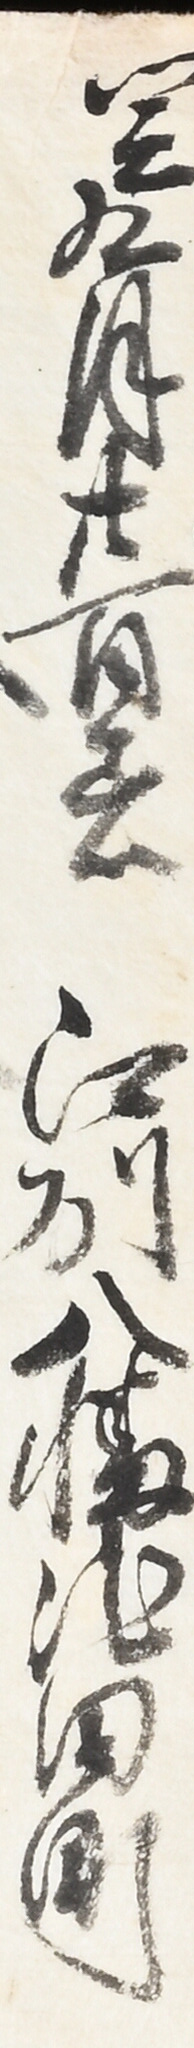閏九月廿一日着江州八幡池田町
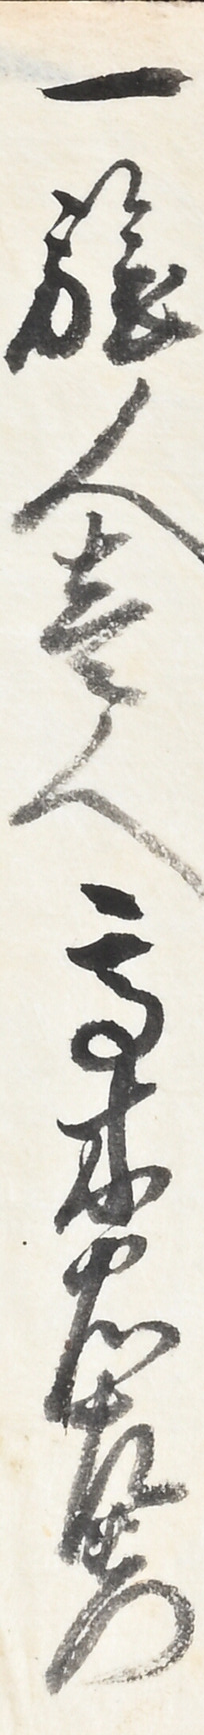一旅人壱人高木忠左衛門

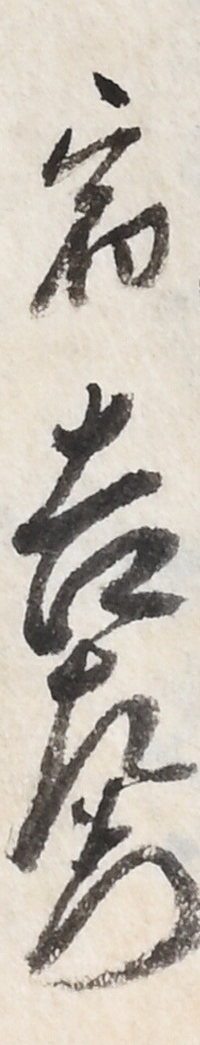宿常右衛門
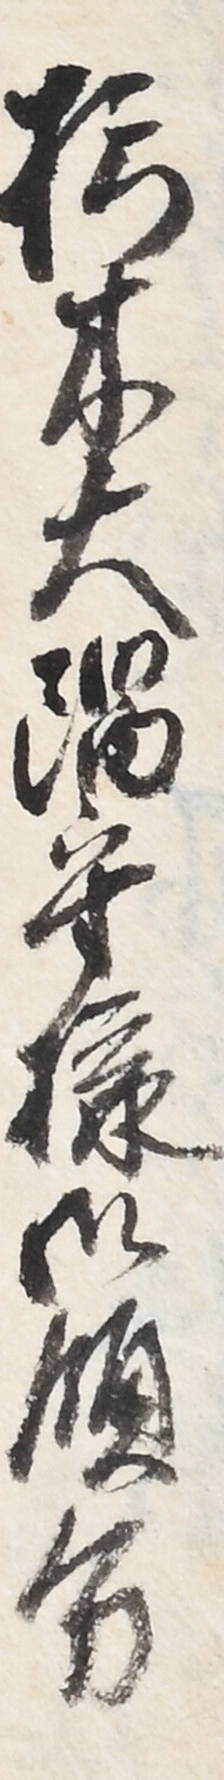朽木唯五郎様御領分
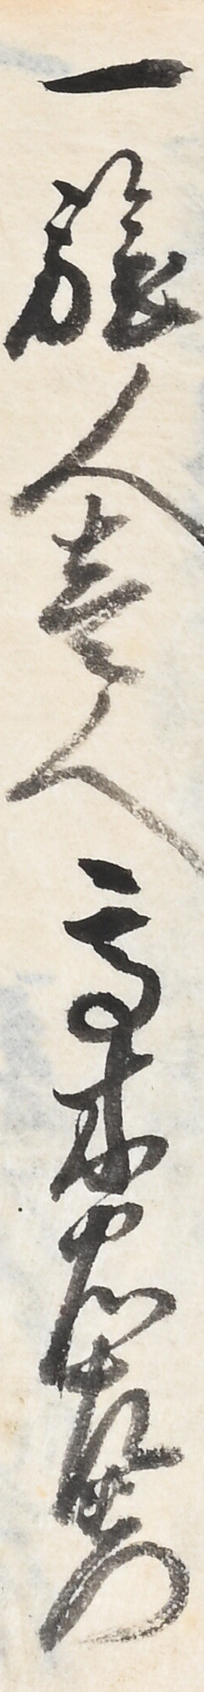一旅人壱人黒屋新右衛門
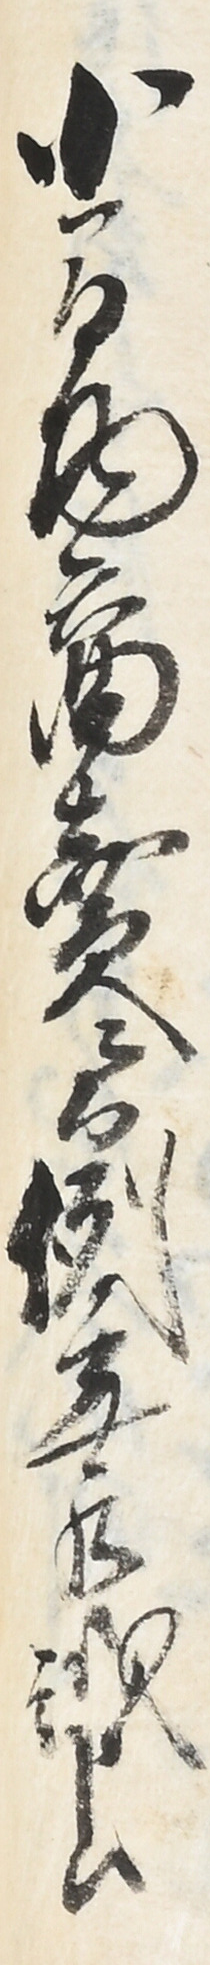小間物商売ニ而例年罷越申候
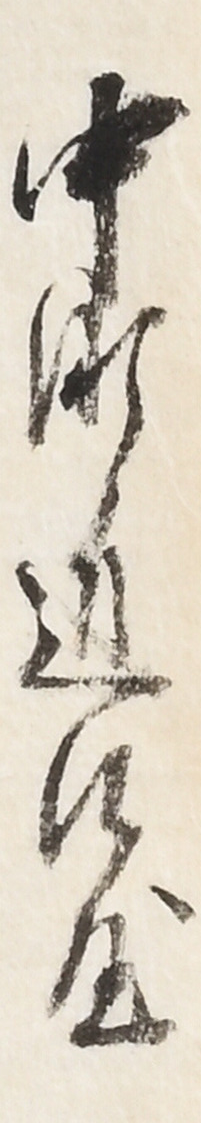中町近江屋
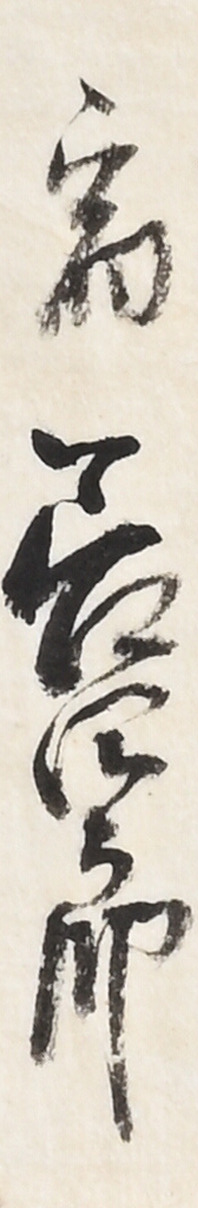宿善四郎
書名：旅人泊控帳
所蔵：伊那市立高遠町図書館・合同会社AMANE
